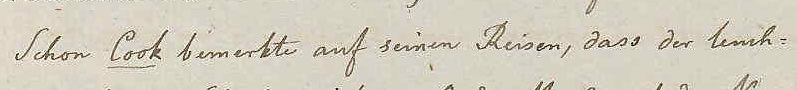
Schon Cook bemerkte auf seinen Reisen, dass der leuch-
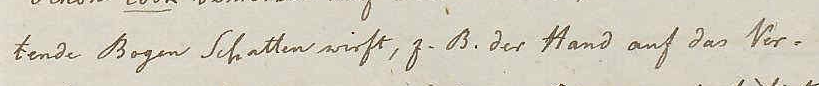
tende Bogen Schatten wirft, z. B. der Hand auf das Ver-
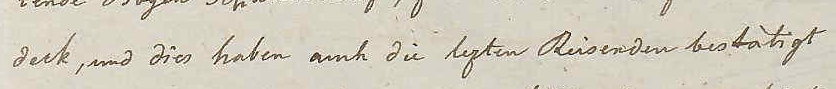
deck, und dies haben auch die lezten Reisenden bestätigt
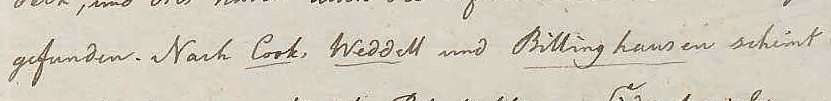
gefunden. Nach Cook, Weddell und Billinghausen scheint
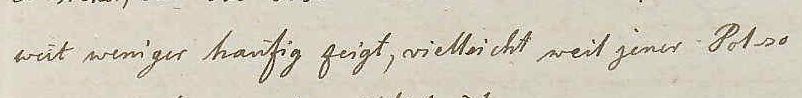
weit weniger häufig zeigt, vielleicht weil jener Pol so
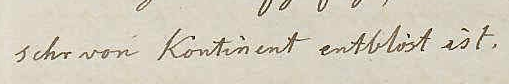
sehr von Kontinent entblöst ist.
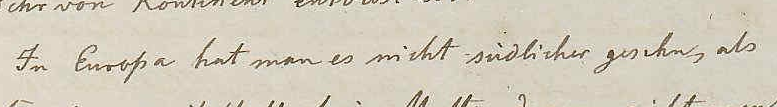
In Europa hat man es nicht südlicher gesehn, als
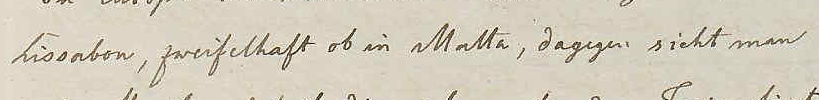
Lissabon, zweifelhaft ob in Malta, dagegen sieht man
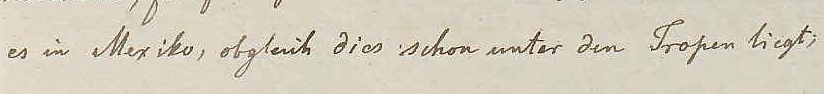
es in Mexiko, obgleich die schon unter den Tropen liegt;
